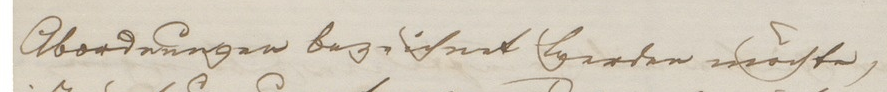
Abordnungen bezeichnet werden möchte,
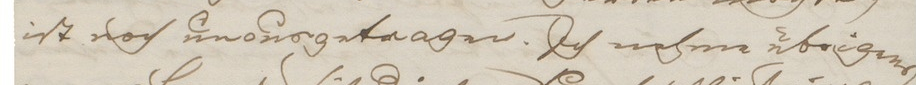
ist noch unausgetragen. Ich nehme übrigens
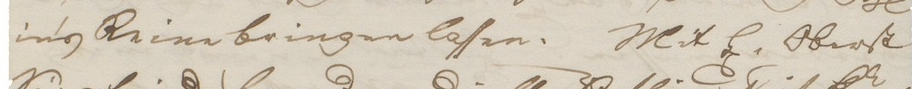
in's Reine bringen lassen. Mit H. Oberst
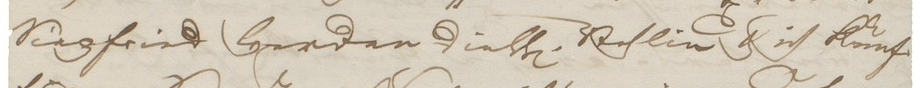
Siegfried werden die HH. Stehlin & ich künf-
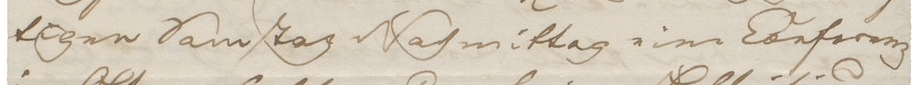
tigen Samstag Nachmittag eine Conferenz
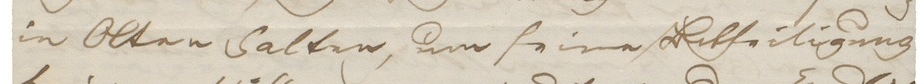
in Olten halten, um seine Betheiligung
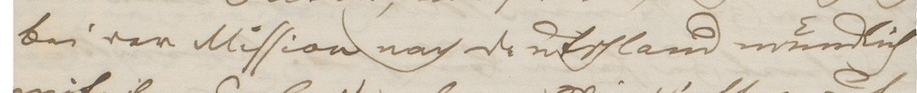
bei der Mission nach Deutschland mündlich
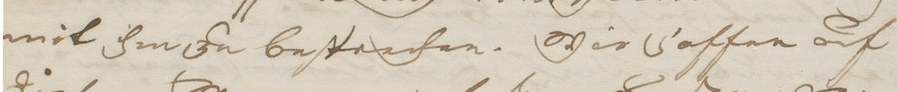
mit ihm zu besprechen. Wir hoffen auf
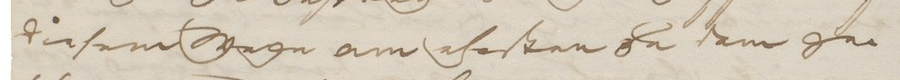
diesen Wege am ehesten zu dem ge-
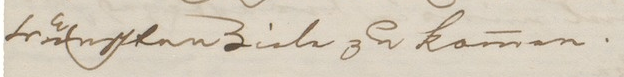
wünschten Ziele zu kommen.
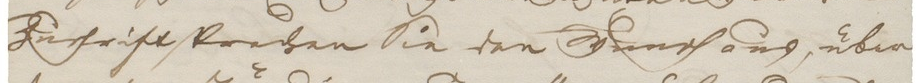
Zuschrift sprechen Sie den Wunsch aus, über
